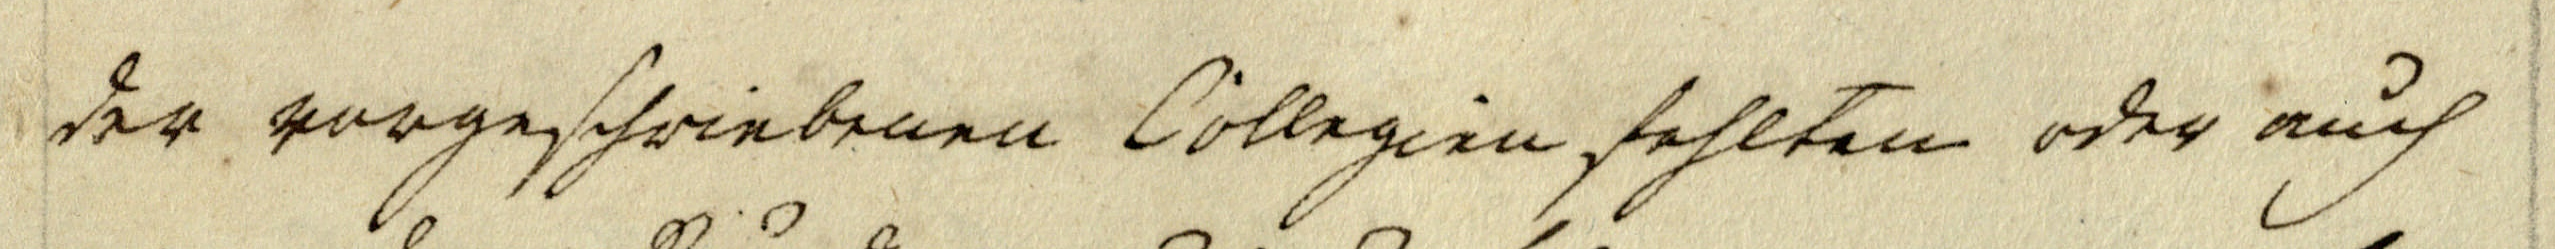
der vorgeschriebenen Collegien fehlten oder auch
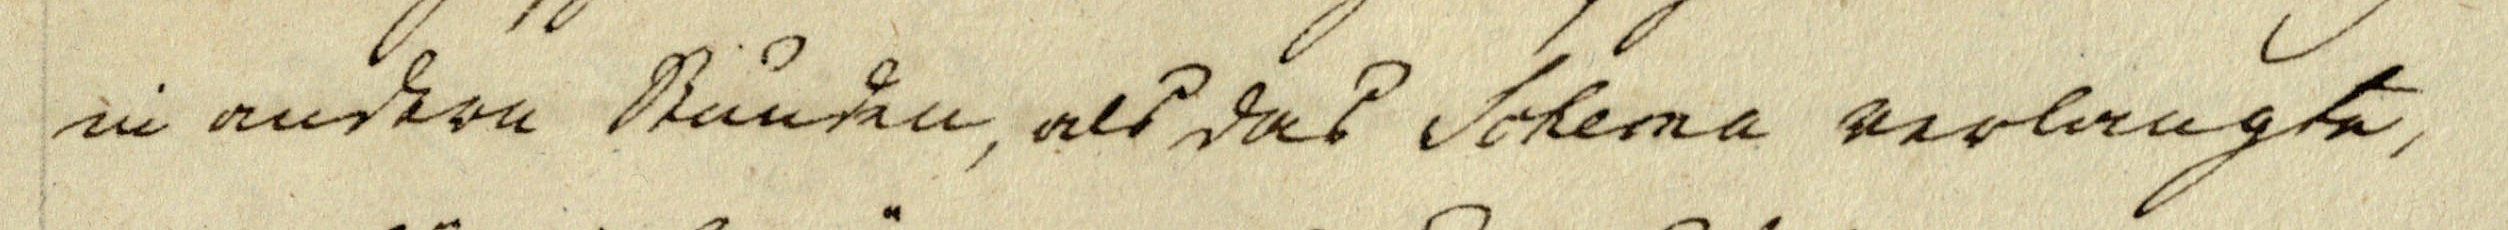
in andern Stunden, als das Schema verlangte,
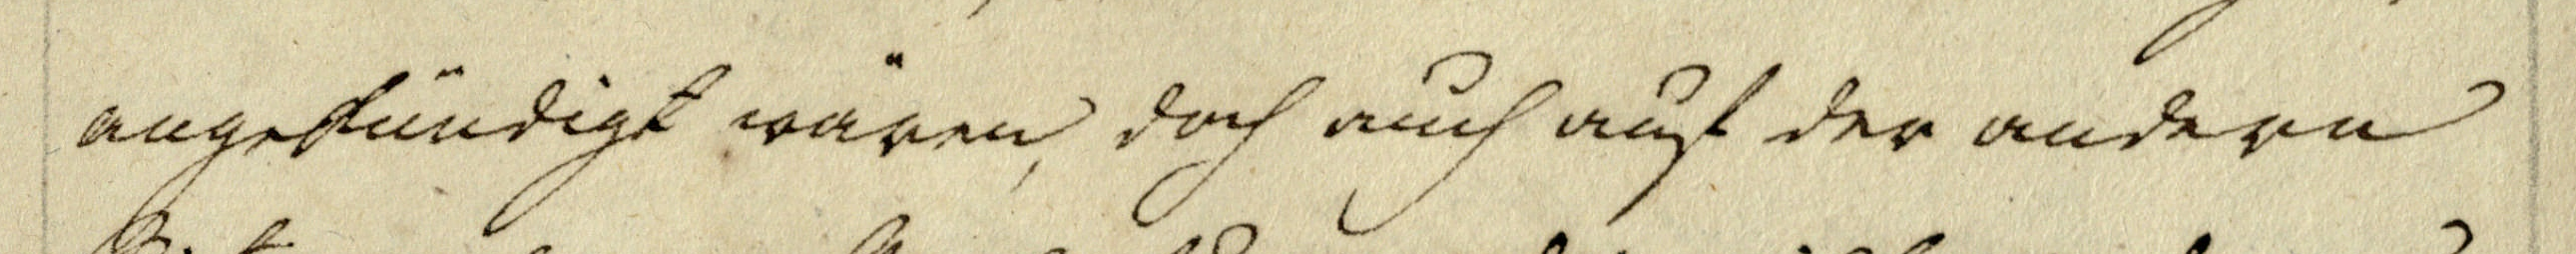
angekündigt wären, doch auch auf der andern
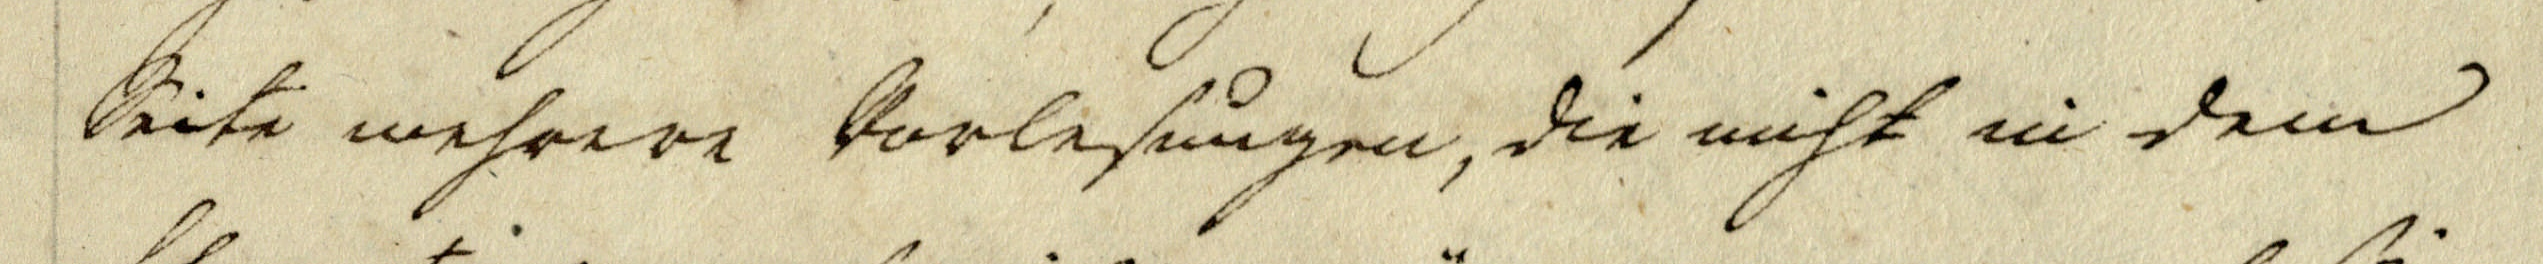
Seite mehrere Vorlesungen, die nicht in dem
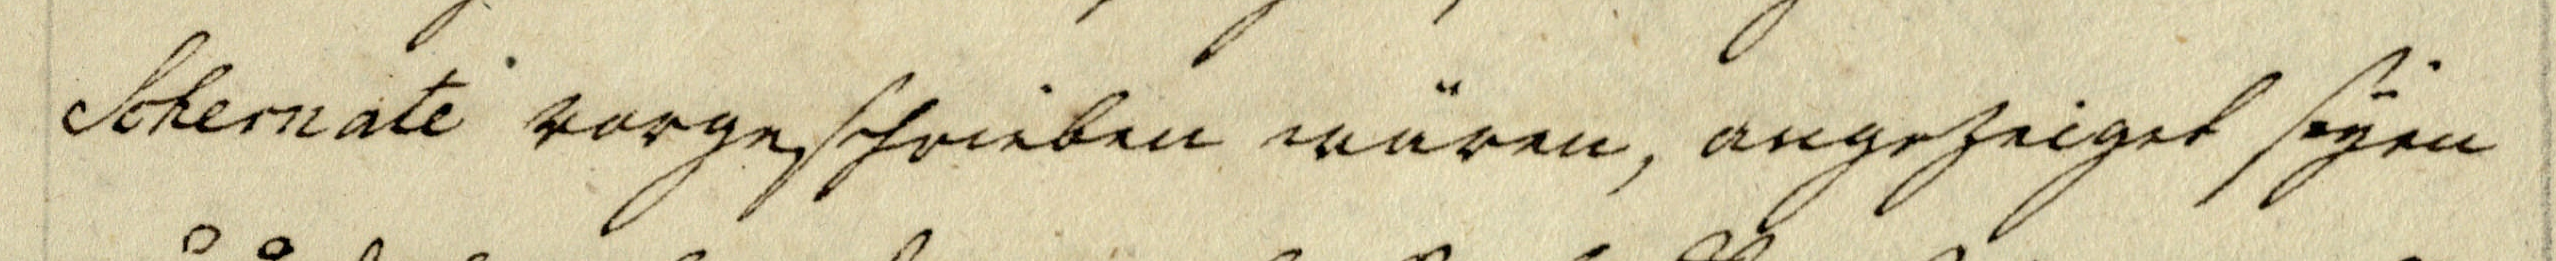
Schemate vorgeschrieben wären, angezeiget seÿen
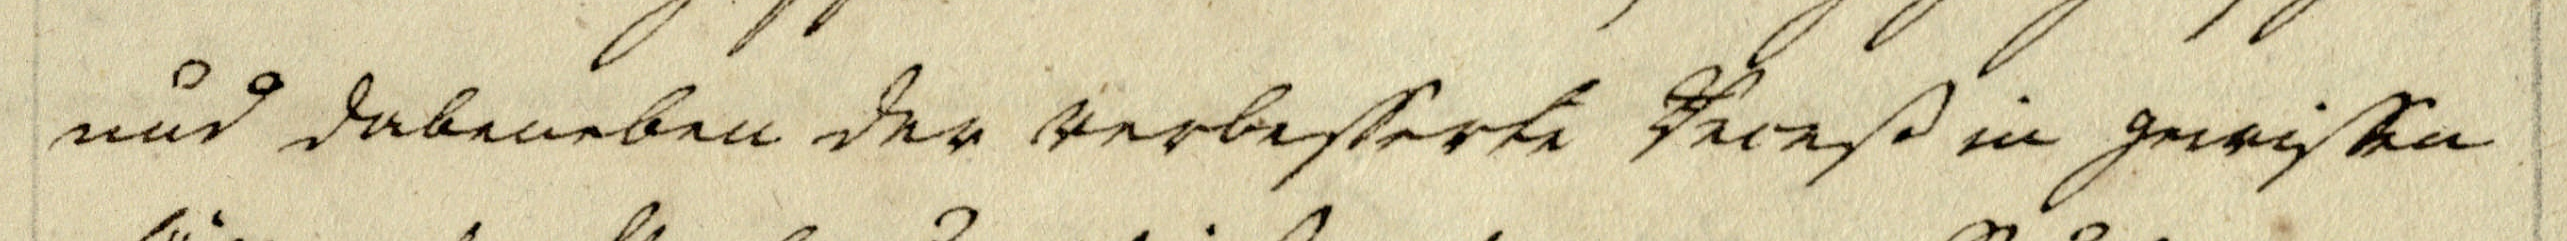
und dabeneben der verbesserte Receß in gewissen
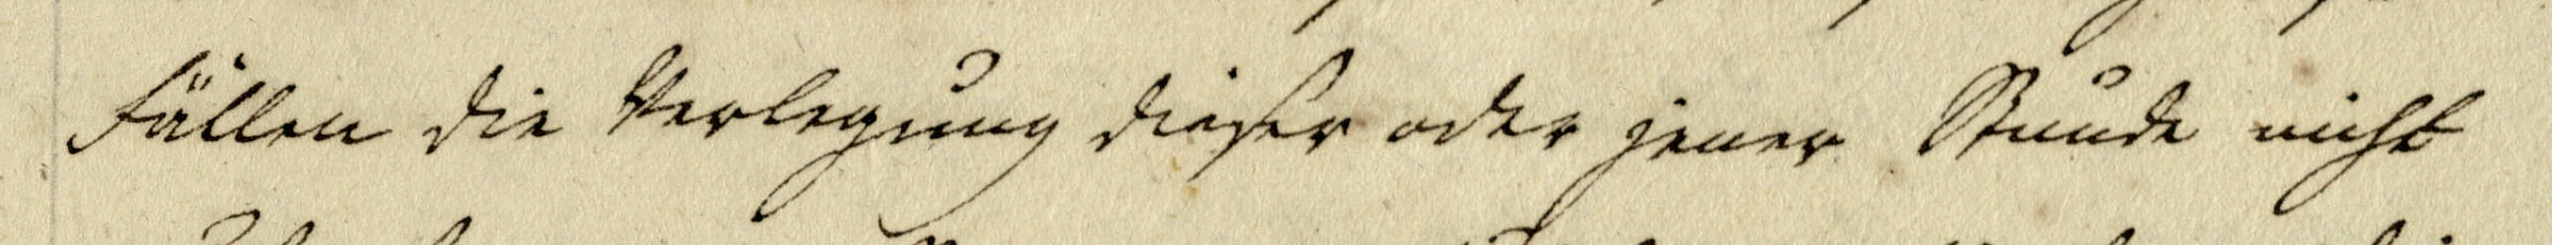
Fällen die Verlegung dieser oder jener Stunde nicht
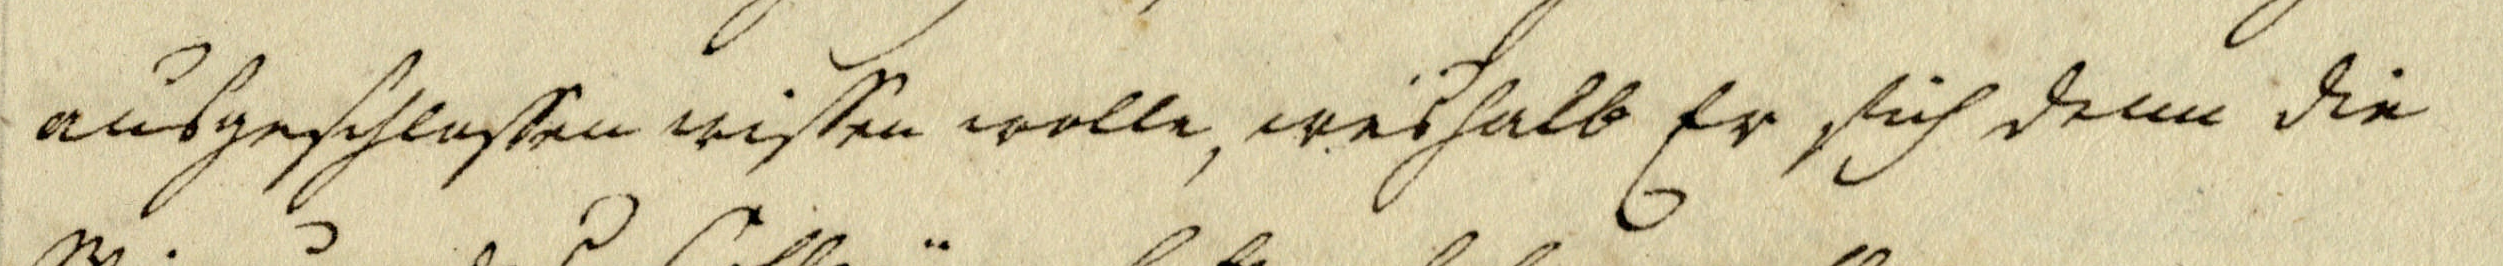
ausgeschlossen wissen wolle, weshalb Er sich denn die
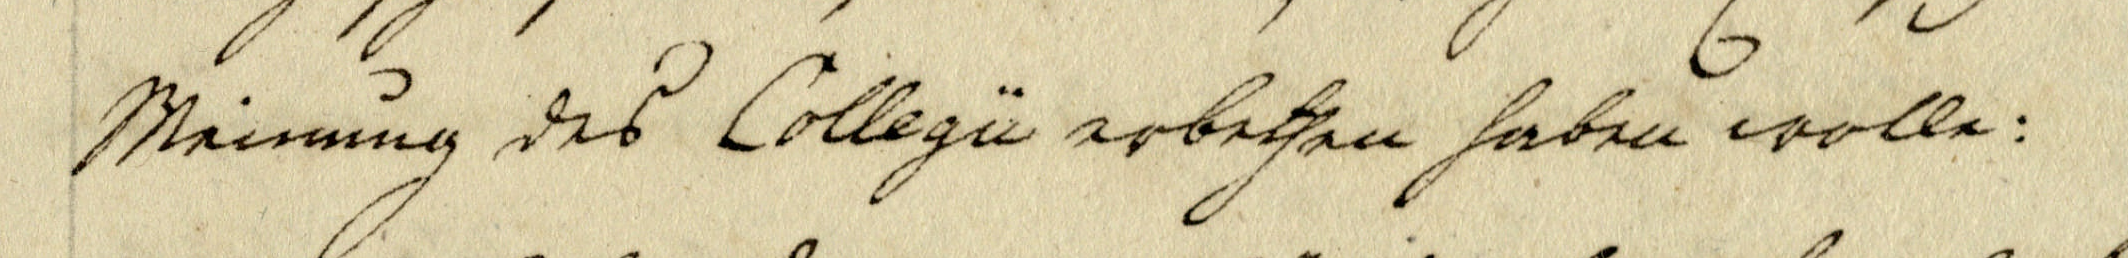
Meinung des Collegii erbethen haben wolle:
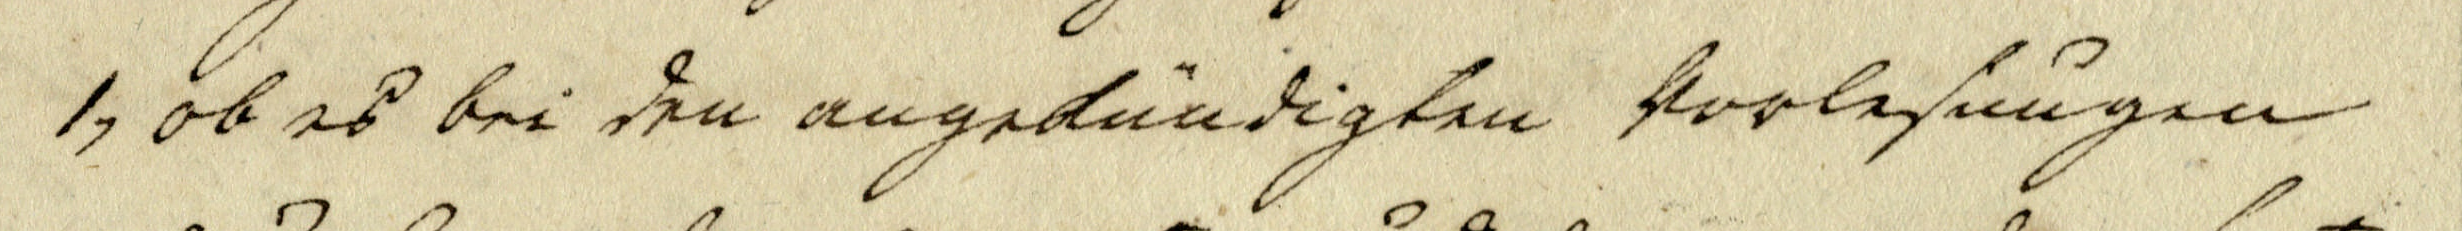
1, ob es bei den angekündigten Vorlesungen
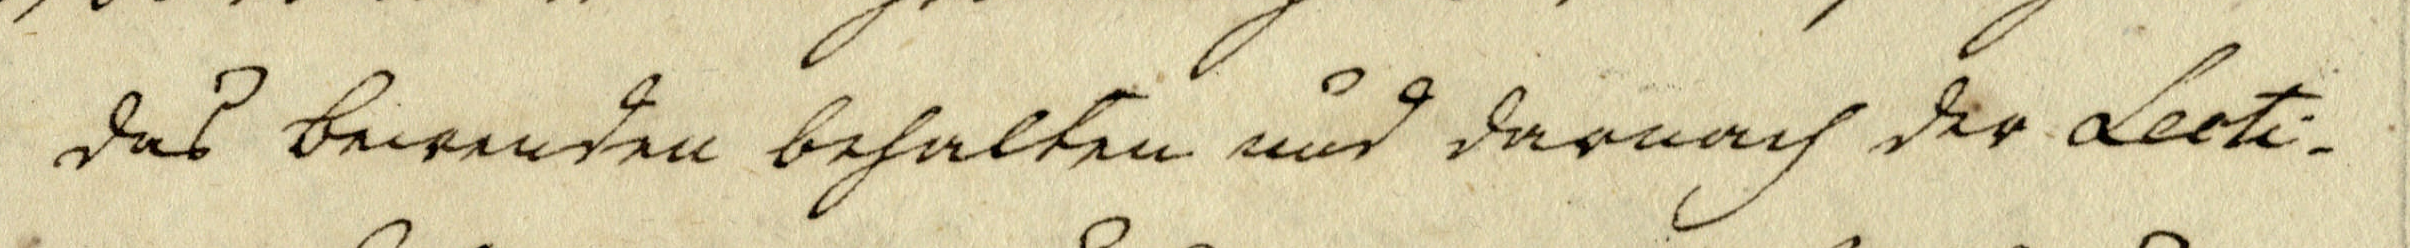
das Bewenden behalten und darnach der Lecti¬
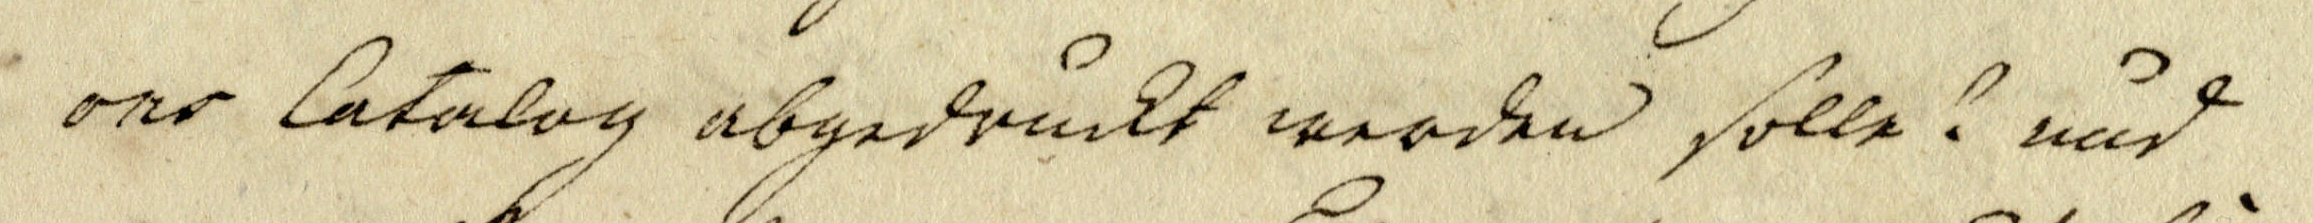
ons Catalog abgedruckt werden solle? und
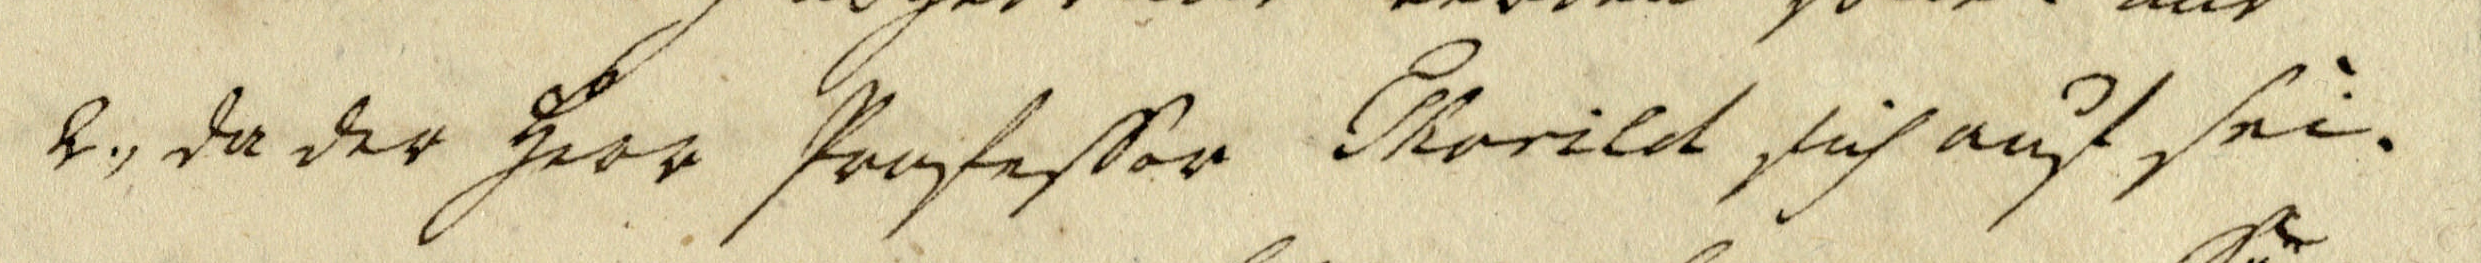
2., da der Herr Professor Thorild sich auf sei¬
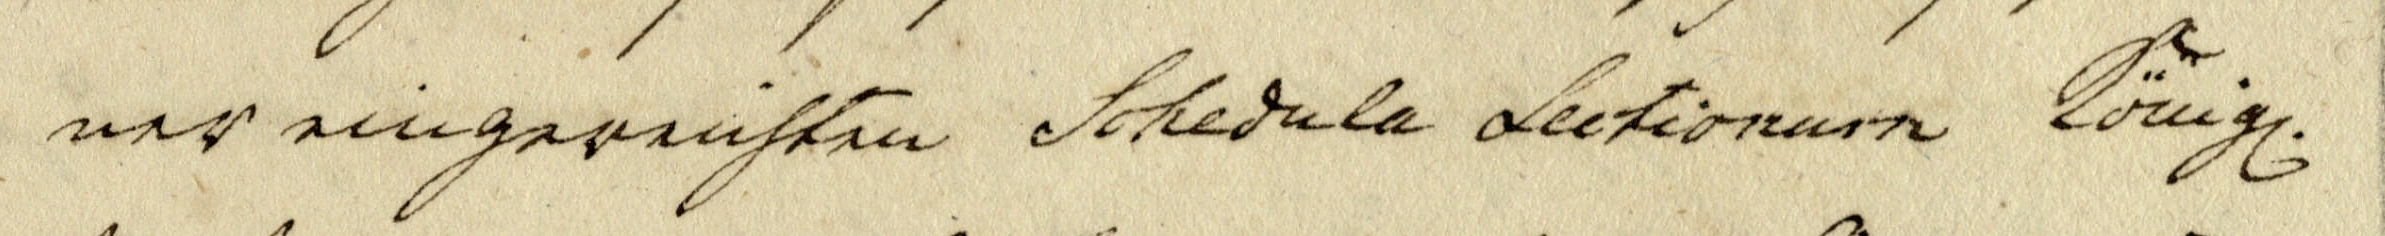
ner eingereichten Schedula Lectionum Königl.
